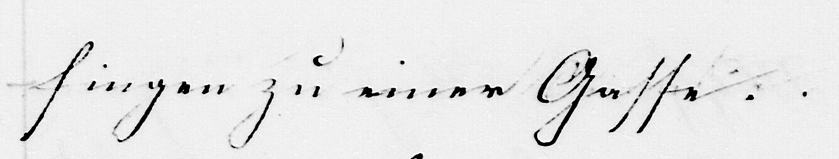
fingen zu einer Gasse.
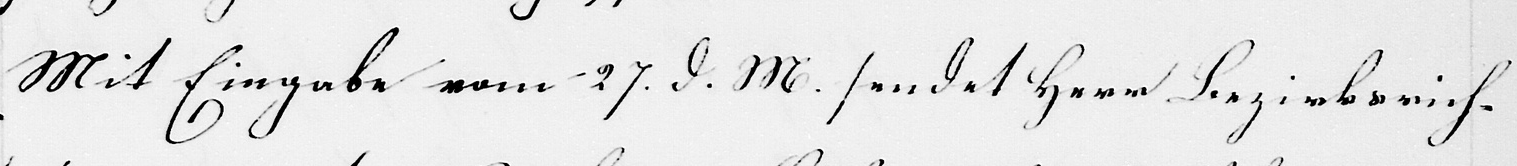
Mit Eingabe vom 27. d. M. sendet Herr Bezirksrich¬
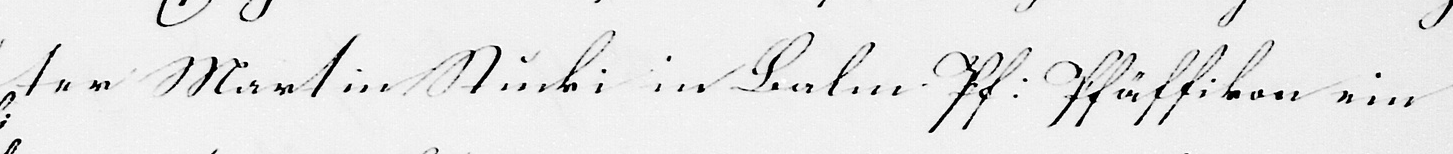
ter Martin Stucki in Balm Pf: Pfäffikon ein
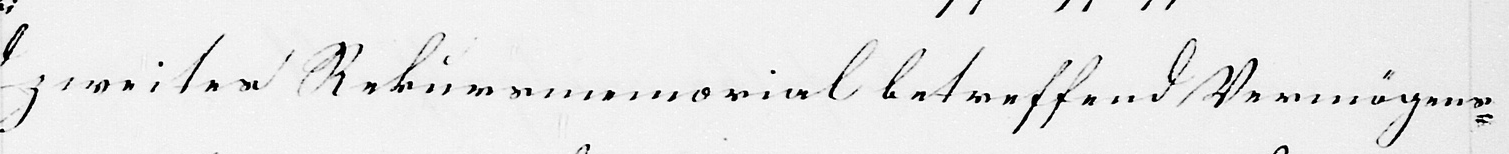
zweites Rekursmemorial betreffend Vermögens¬
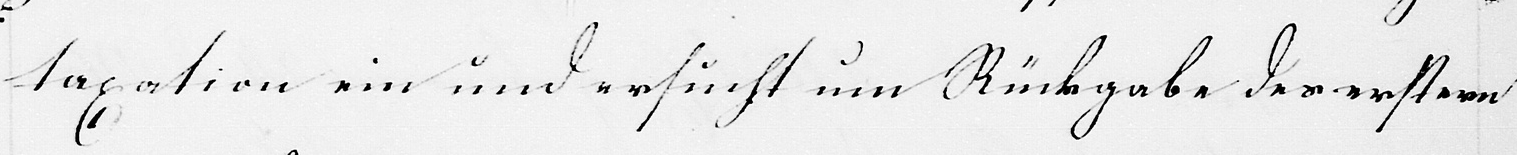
taxation ein und ersucht um Rückgabe des erstern
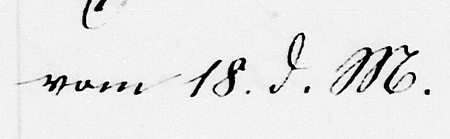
vom 18. d. M.
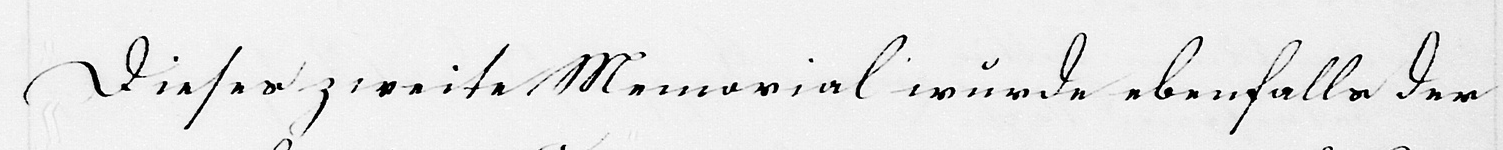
Dieses zweite Memorial wurde ebenfalls der
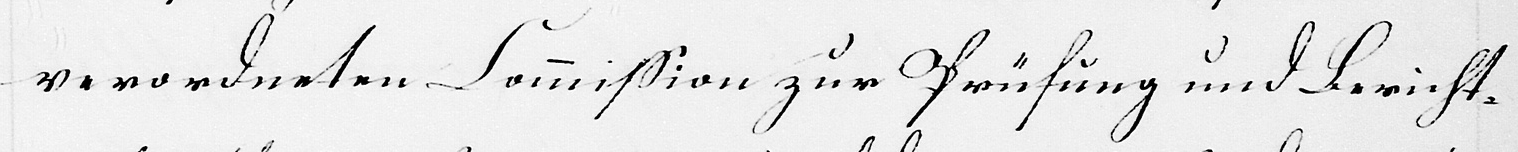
verordneten Commißion zur Prüfung und Bericht¬
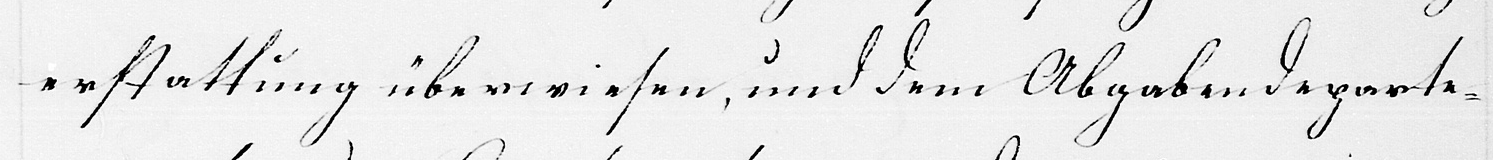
erstattung überwiesen, und dem Abgabendeparte¬
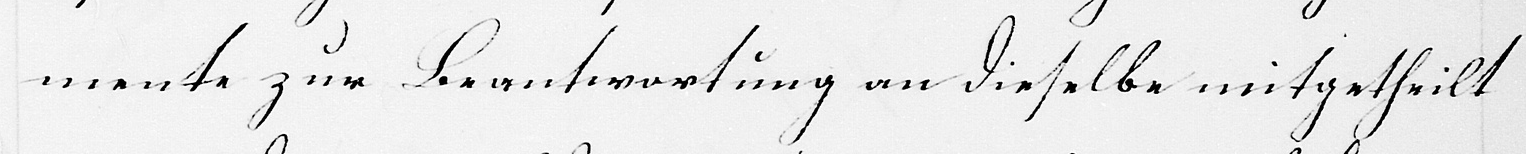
mente zur Beantwortung an dieselbe mitgetheilt
